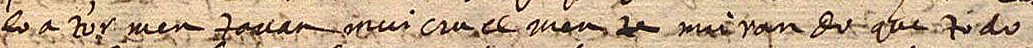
lo atormentauan mui cruelmente mirando que todo
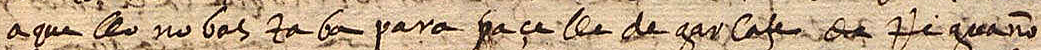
aquello no bastaba para hacelle degar la fe de Reguan̄o
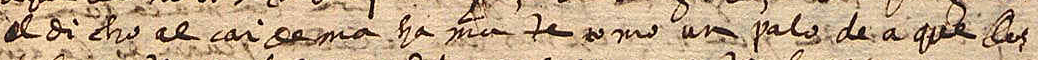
el dicho alcaide mahamute tomo un palo de aquellos
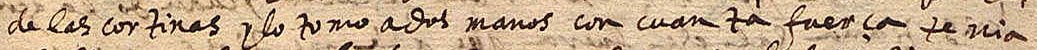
de las cortinas y lo tomo a dos manos con cuanta fuerça tenia
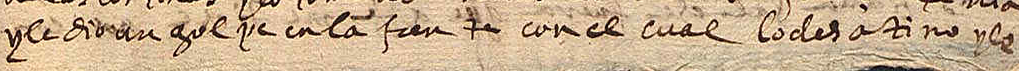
y le dio un golpe en la frente con el cual lo desatino y lo
